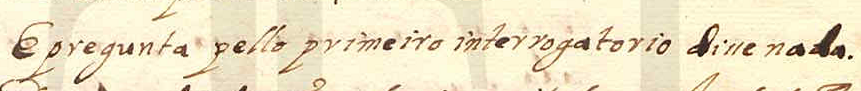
E pregunta pello primeiro interrogatorio disse nada.
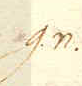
g. n.
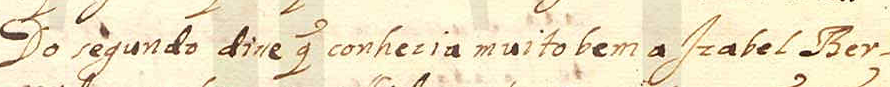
Do segundo disse q̄ conhecia muito bem a Jzabel Ber
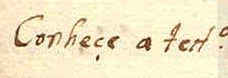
Conhece a test.a
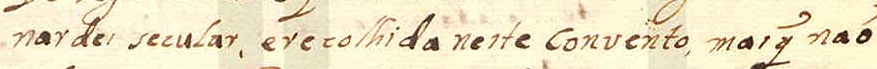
nardes secular, e recolhida neste convento, mas q̄ naõ
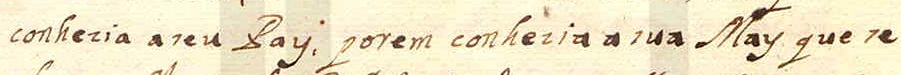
conhecia a seu Pay, porem conhecia a sua May que se
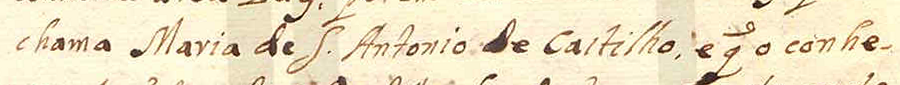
chama Maria de S. Antonio de Castilho, e q̄ o conhe
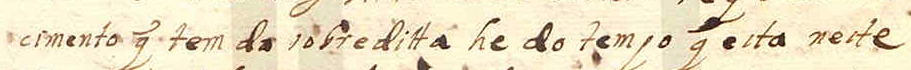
cimento q̄ tem da sobreditta he do tempo q̄ esta neste
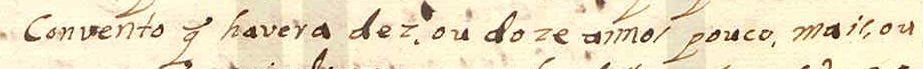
convento q̄ havera dez ou doze annos pouco, mais, ou
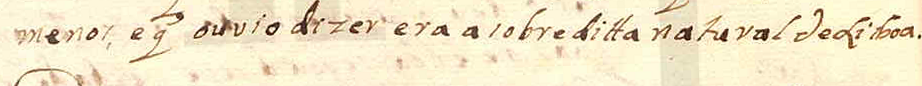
menos, e q̄ ouvio dizer era a sobreditta natural de Lisboa.
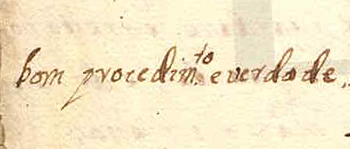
bom procedim.to e verdade.
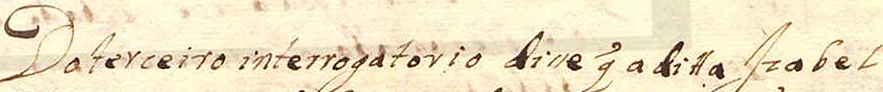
Do terceiro interrogatorio disse q̄ a ditta Jzabel
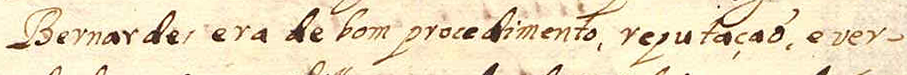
Bernardes era de bom procedimento, reputaçaõ, e ver
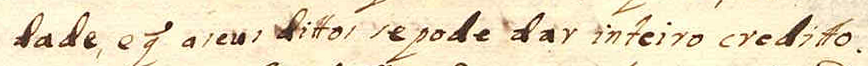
dade, e q̄ a seus dittos se pode dar inteiro creditto.
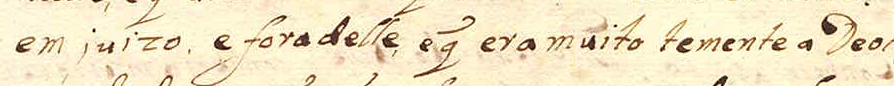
em juizo e fora delle, e q̄ era muito temente a Deos
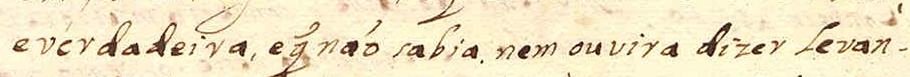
e verdadeira, e q̄ naõ sabia nem ouvira dizer levan
